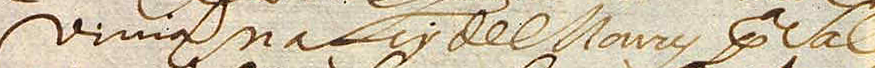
Viuiaõ na Ley de Mouzes pa Sal
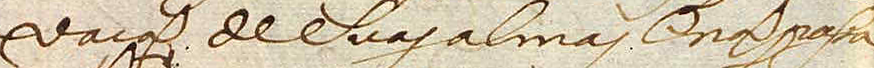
vaçaõ de Suas almas E naõ passa
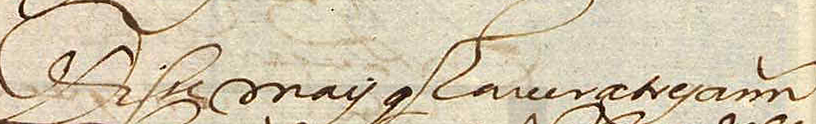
Disse mais q̄ hauera tres ann̄
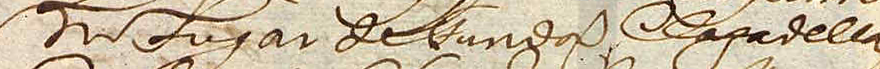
no Lugar de Fundaõ, E Caza della
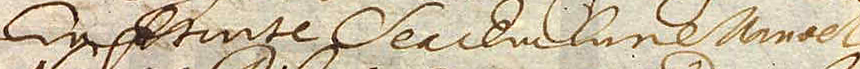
Confitente Se achou Com Manoel
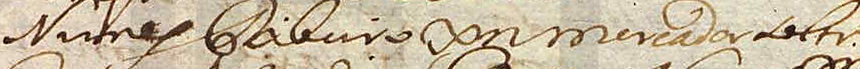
Nunes Ribeiro xn mercador soltr.o
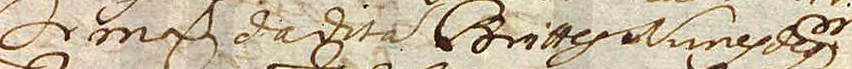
Irmaõ da dita Brittes Nunes de q.m
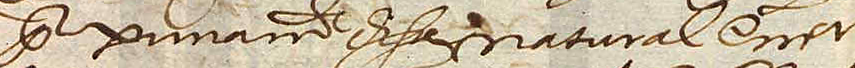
proximamte disse natural e mor
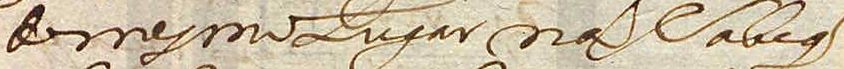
do mesmo Lugar naõ sabe q̄
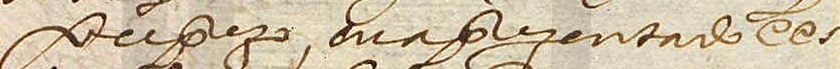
foce prezo, ou aprezentado e es
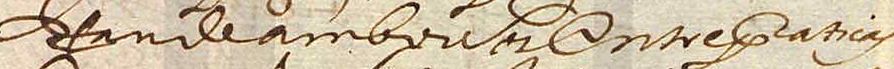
tando ambos Sos Entre praticas
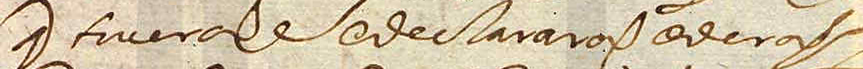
q̄ tiueraõ Se declararaõ e deraõ
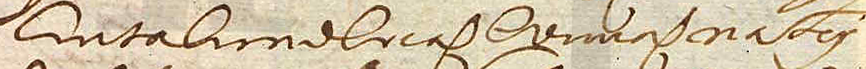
Conta Como Criaõ E viuiaõ na Ley
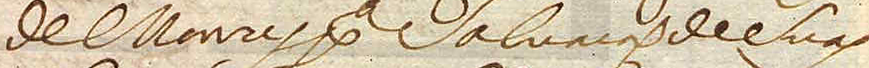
de Mouzes pa Saluacaõ de Suas
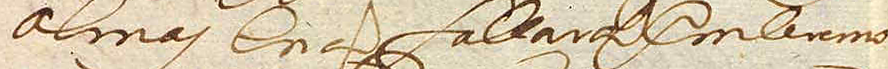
almas E naõ fallaraõ Em Ceremo
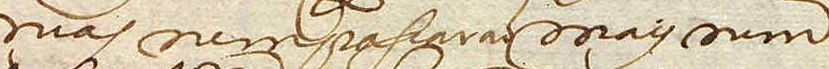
nias nem passaraõ mais nem
